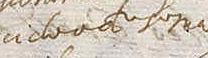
cido o d̄o so ma
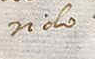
rido.
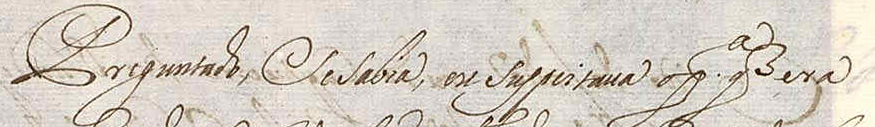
Preguntado, Se sabia, ou suspeitaua o p.a q̄ era
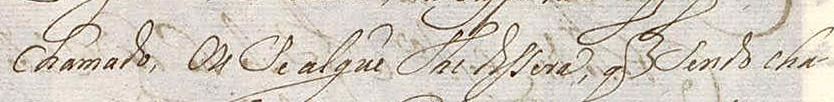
chamado, Ou Se alguē lhe dissera, q̄ sendo cha-
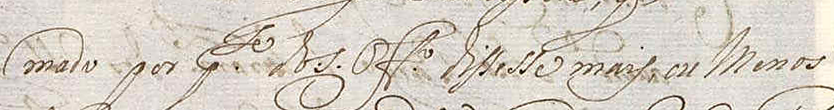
mado por p.te do S. Off.o dissesse mais, ou Menos
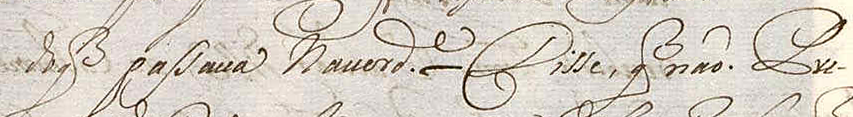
do q̄ passaua Na uerd.e - Disse, q̄ naõ. Pre
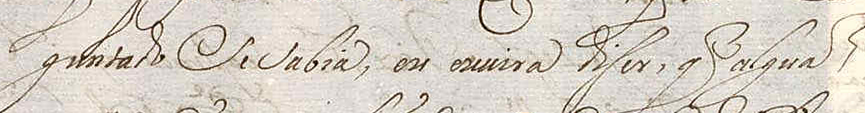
guntado Se sabia, ou ouuira diser, q̄ alguā
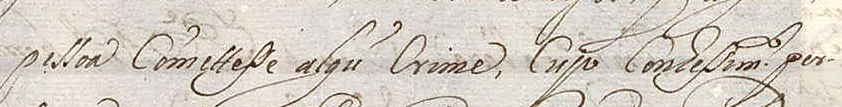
pessoa Com̄ettesse algū Crime, Cujo Conhessim.to per
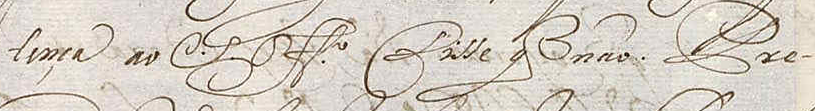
tença ao S. Off.o Disse q̄ não. Pre
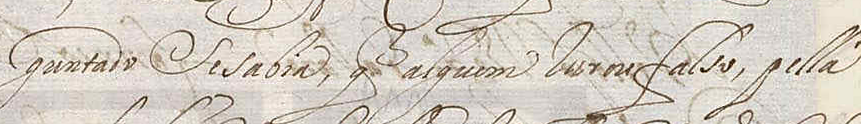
guntado Se Sabia, q̄ alguem Iurou falso, pella
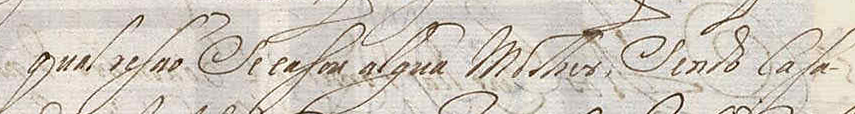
qual resaõ Se casou alguā Molher. Sendo Casa
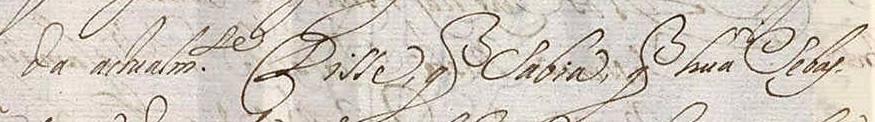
da actualm.te Disse, q̄ Sabia, q̄ huā Sebas
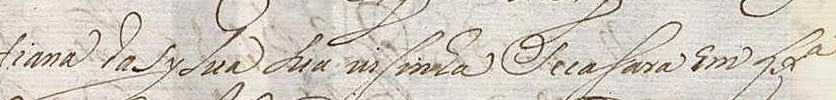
tiana da Sylua Sua visinha Se casara Em Lxa
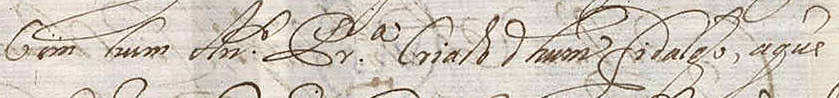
Com hum An.to Pr.a Criado d̄ hum fidalgo, a quē
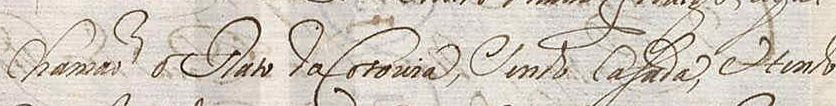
Chamaõ o Rato da Cotouia, Sendo Casada, & tendo
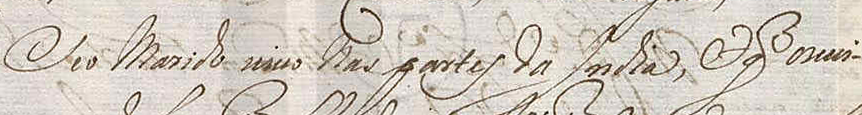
Seo Marido uiuo nas partes da Jndia, & q̄ ouui
